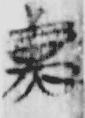具
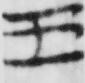王
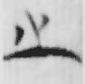之
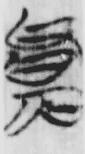○（爨）
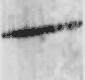一
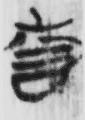青
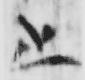之
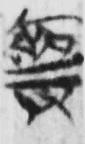齎
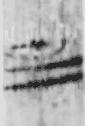足
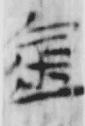金
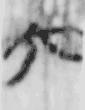六
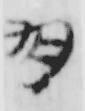匀（鈞）
